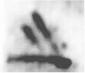之
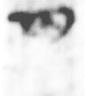四
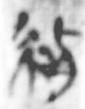紫
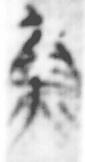魚
